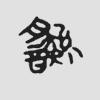{爪言糸}
